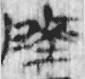陵
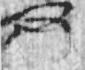尹
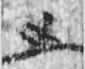之
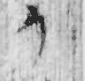人
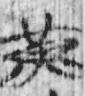黃
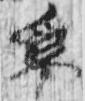奚
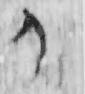人
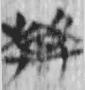登
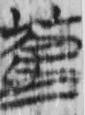蒼
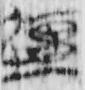疆
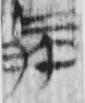馭（御）
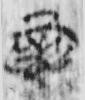婁
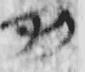○（間）
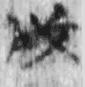戊
